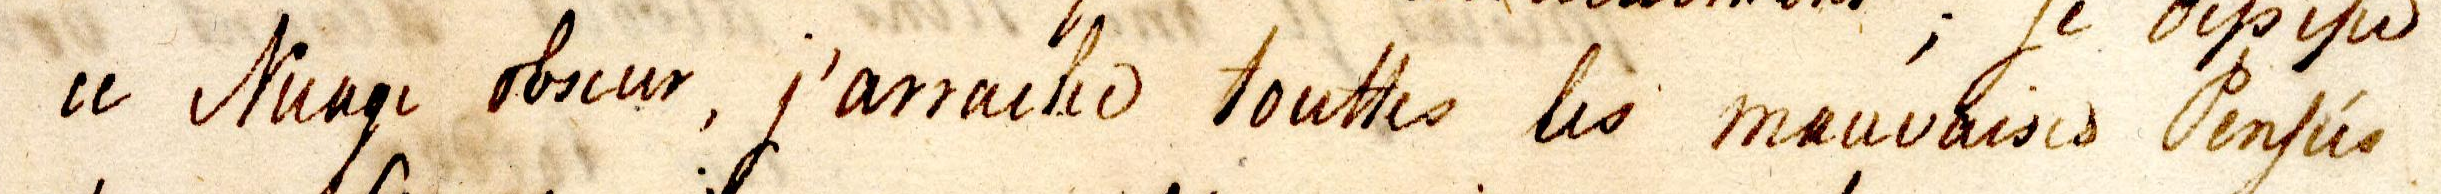ce Nuage obscur, j'arrache touttes les mauvaises Pensés
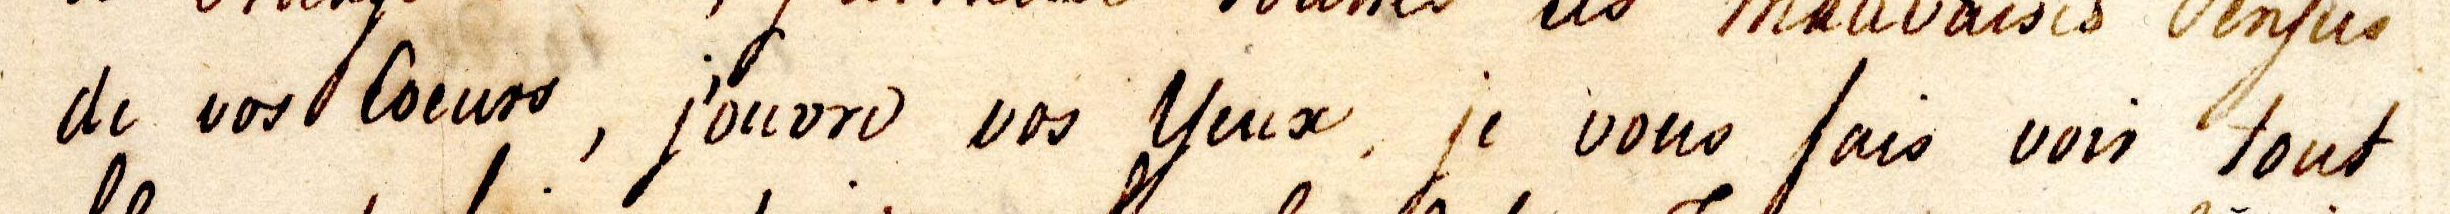de vos Coeurs, j'ouvre vos Yeux, je vous fais vois tout
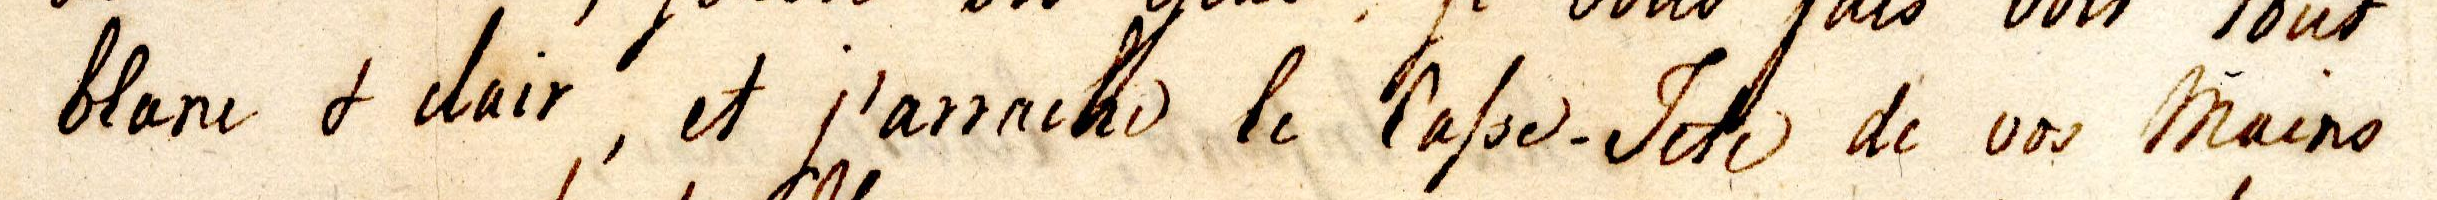blanc & clair, et j'arrache le Casse-Tete de vos Mains
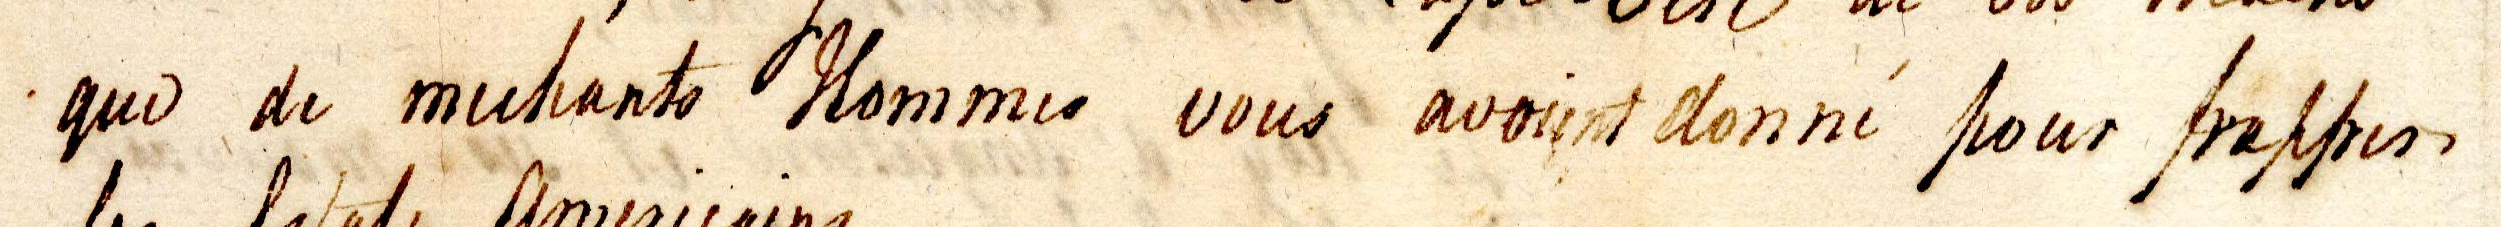que de mechánts Hommes vous avoint donné pour frapper
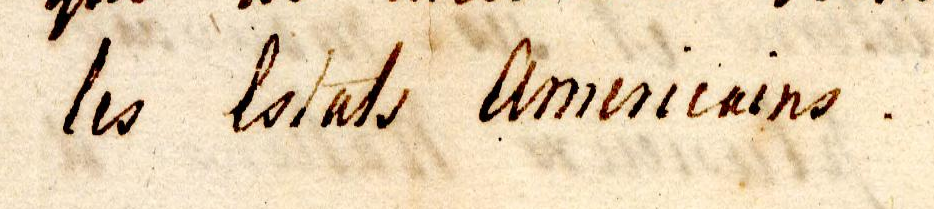les Estats Americains
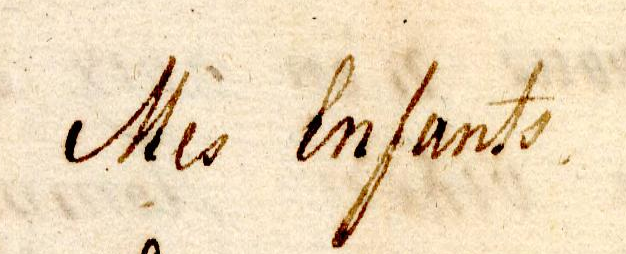Mes Enfants,
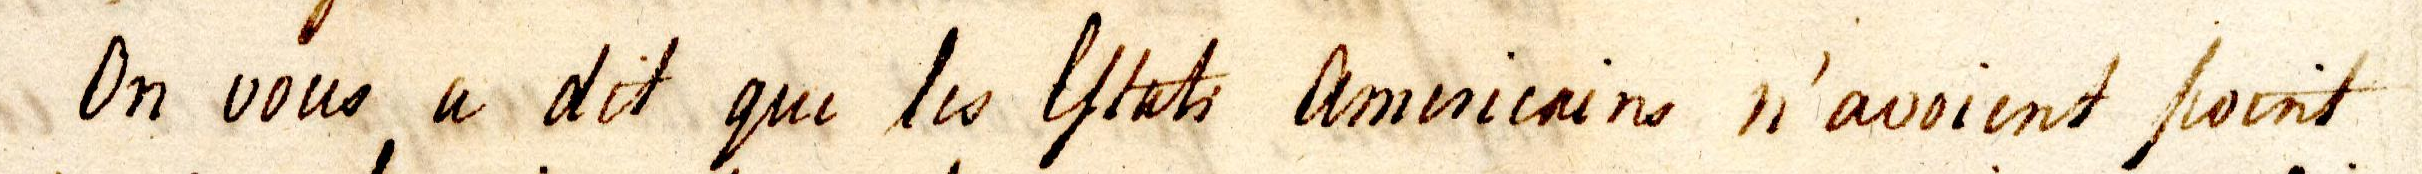On vous a dit que les Estats Americains n'avoient point
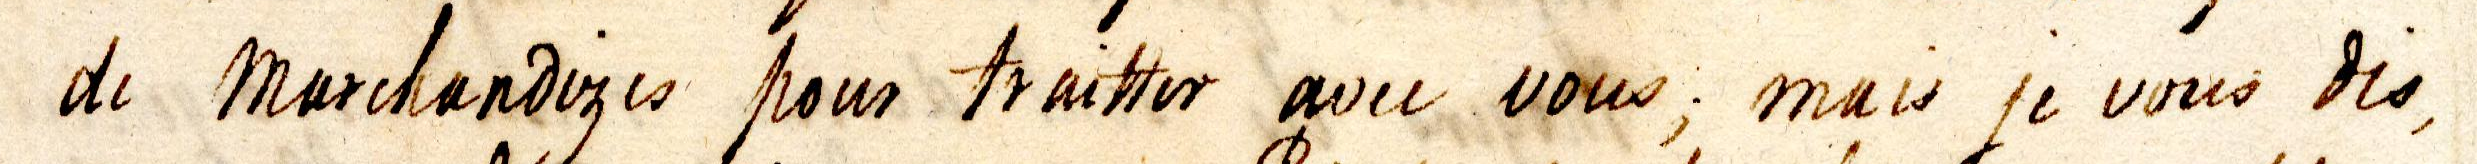de Marchandizes pour traitter avec vous; mais je vous dis
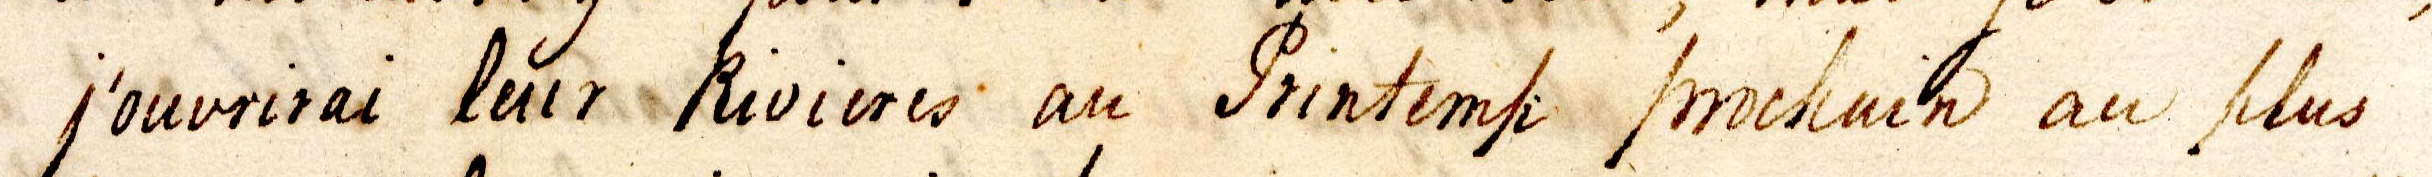j'ouvrirai leur Rivieres au Printemp prochain au plus
